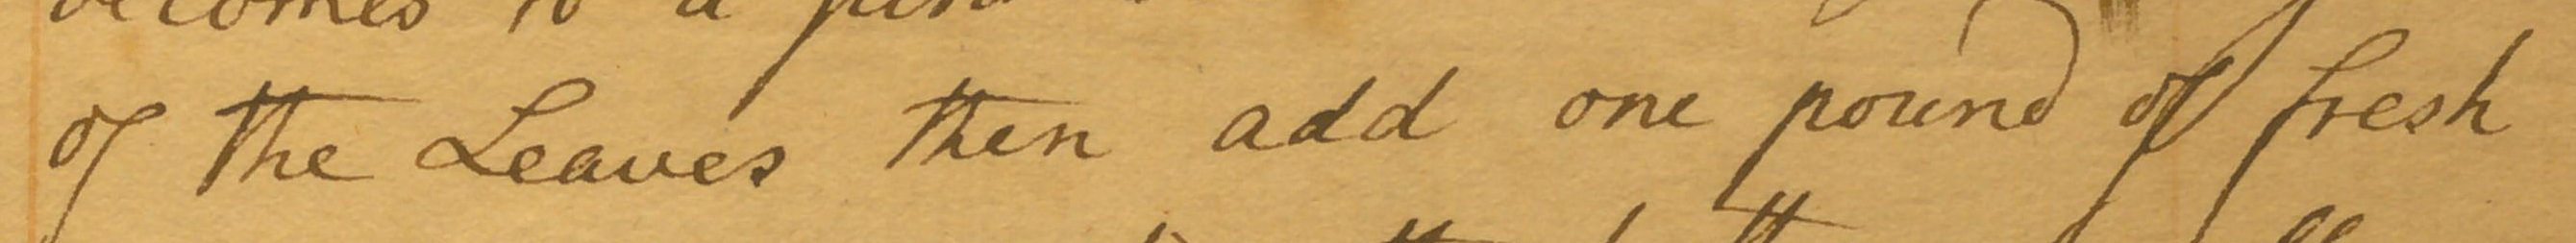of the Leaves then add one pound of fresh
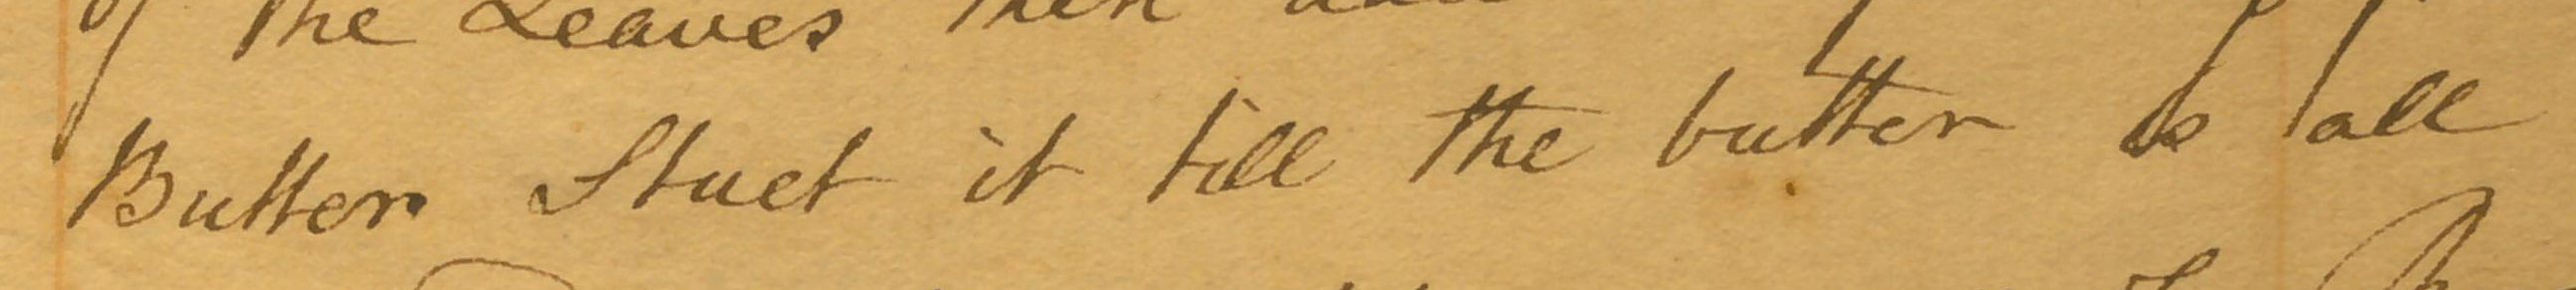Butter Stuet it till the Butter is all
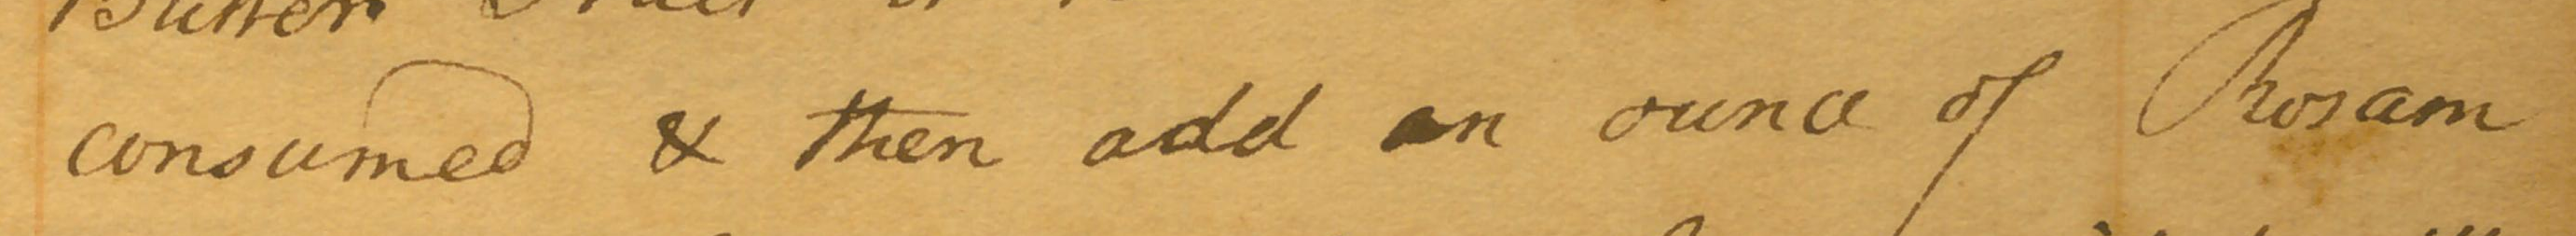consumed & then add an ounce of Rosam
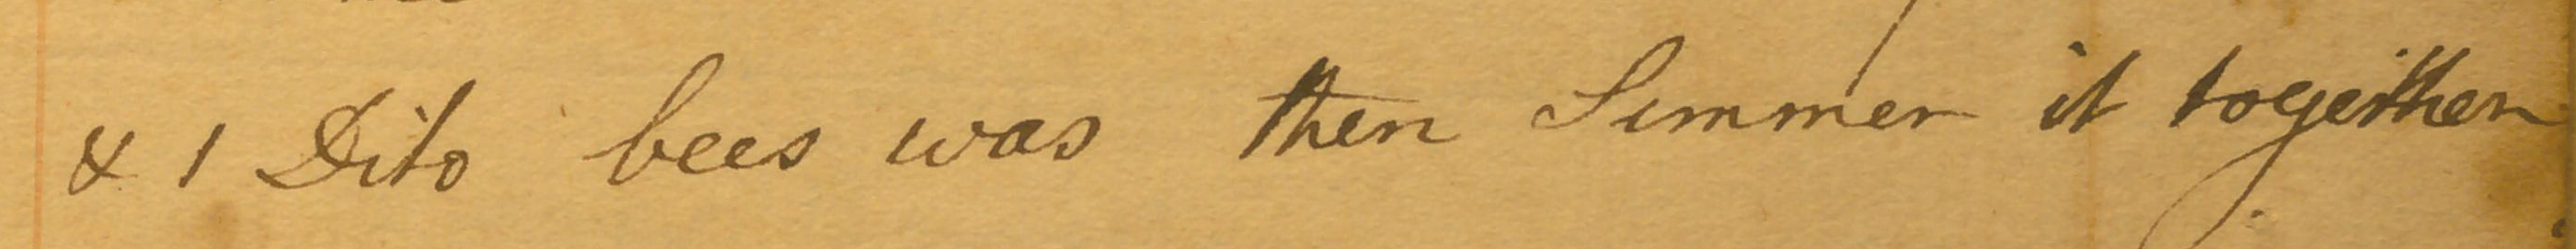& 1 Dito bees wax then Simmer it together
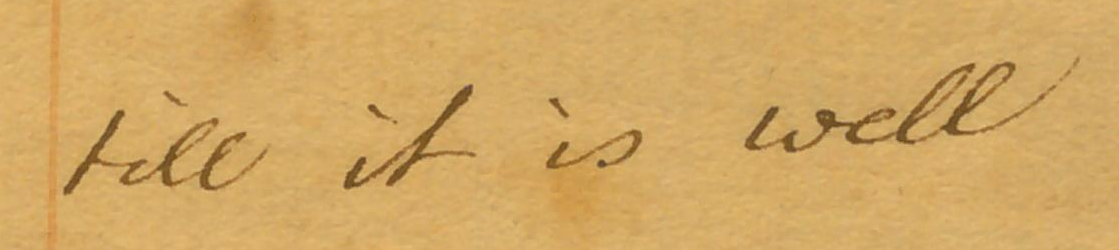till it is well
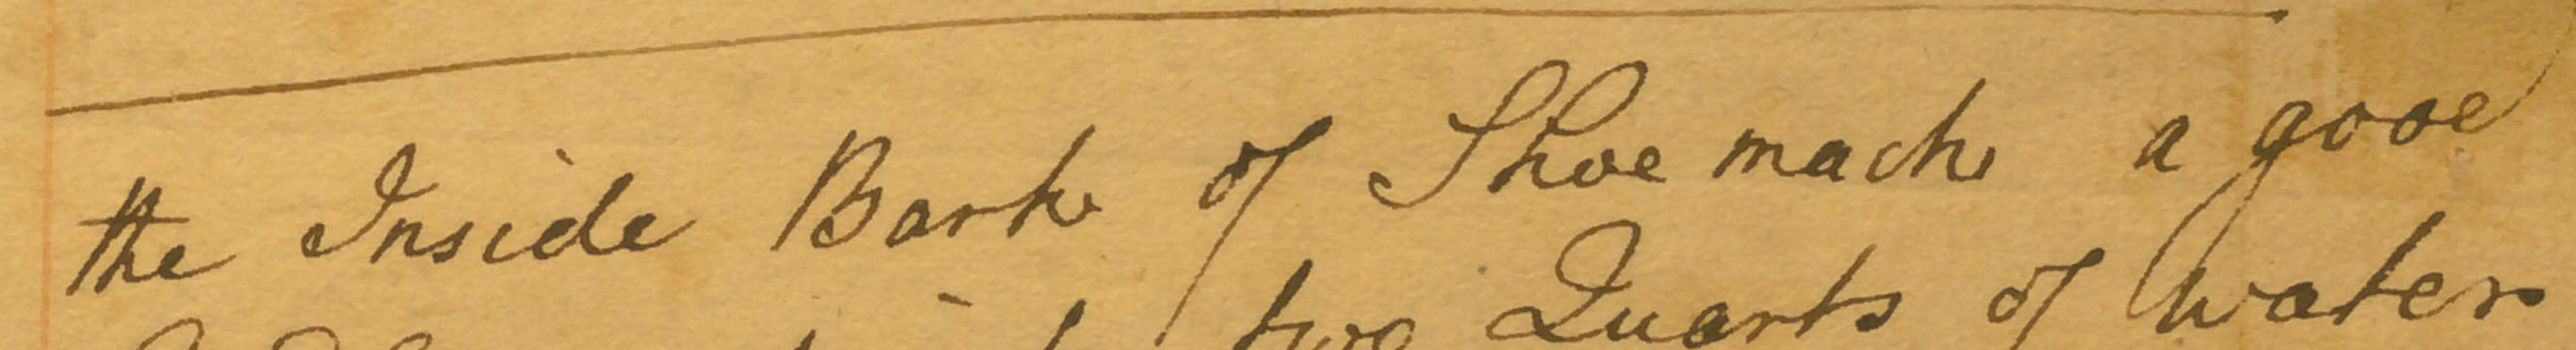the Inside Bark of Shoemach a good
